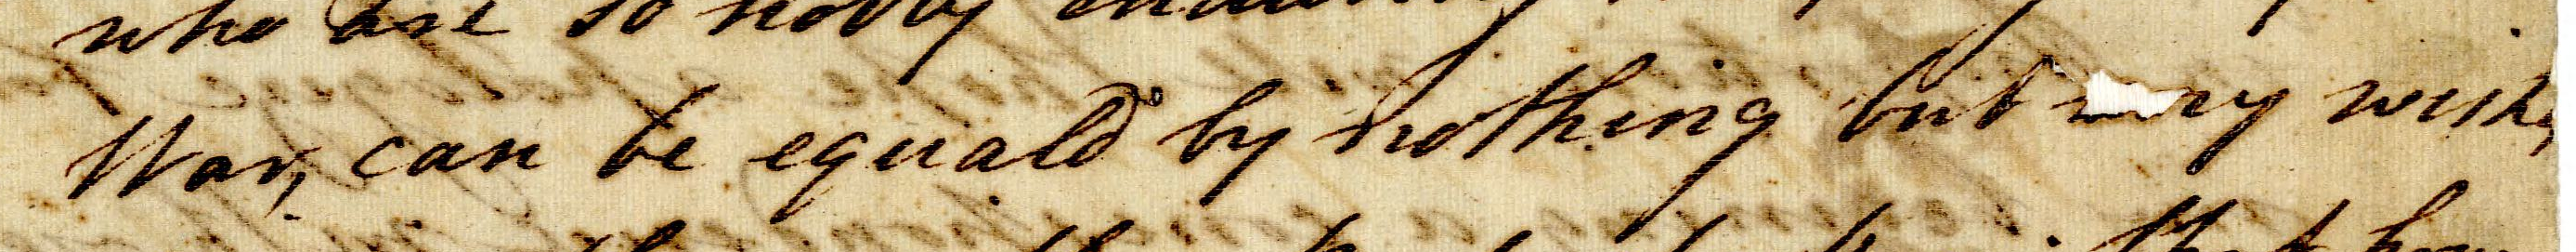War, can be equald by nothing but my wishes
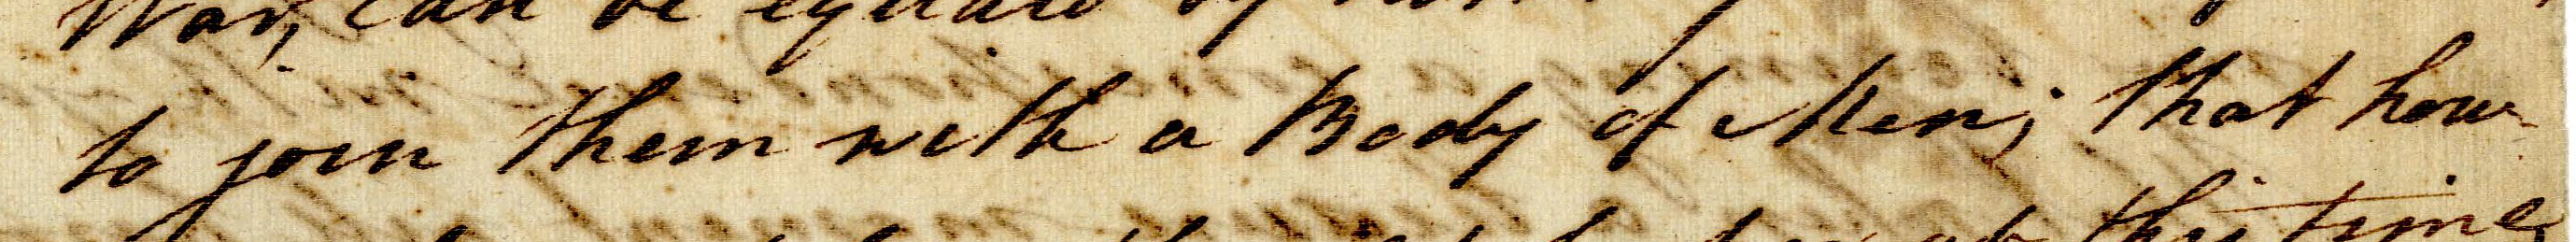to join them with a Body of Men; that how
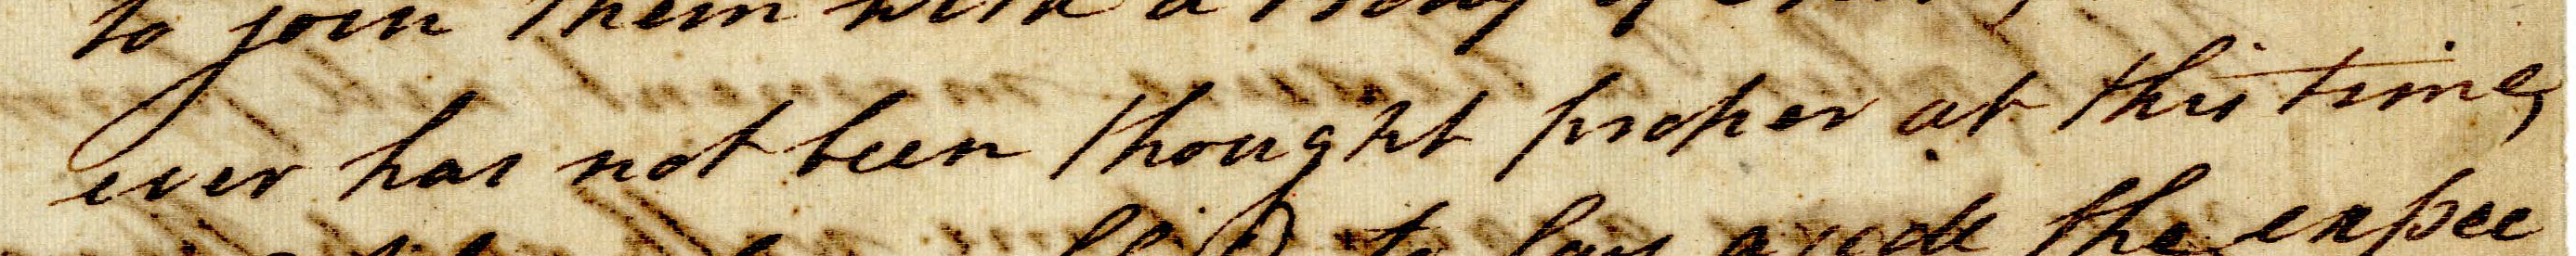ever has not been thought proper at this time,
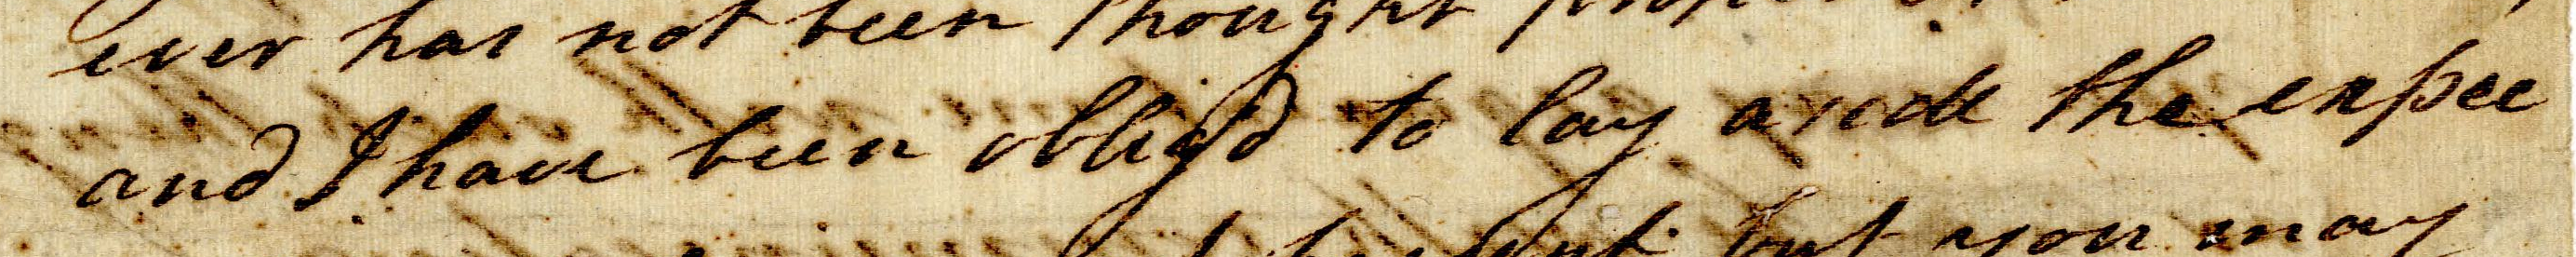and I have been oblig'd to lay aside the expec
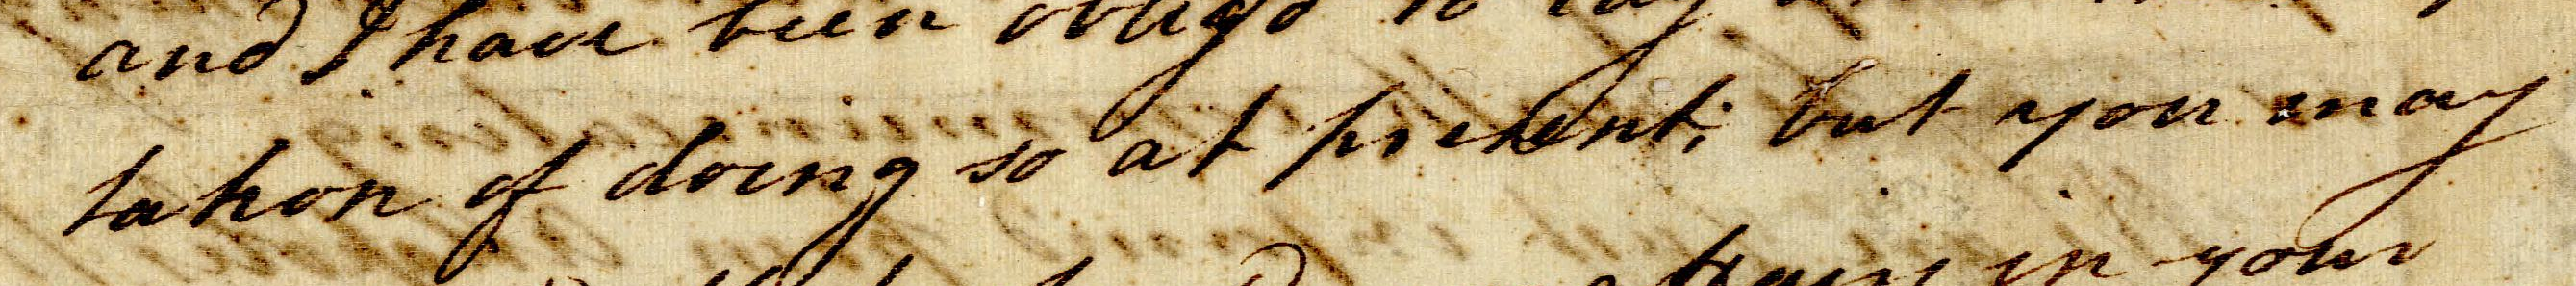tation of doing so at present; but you may
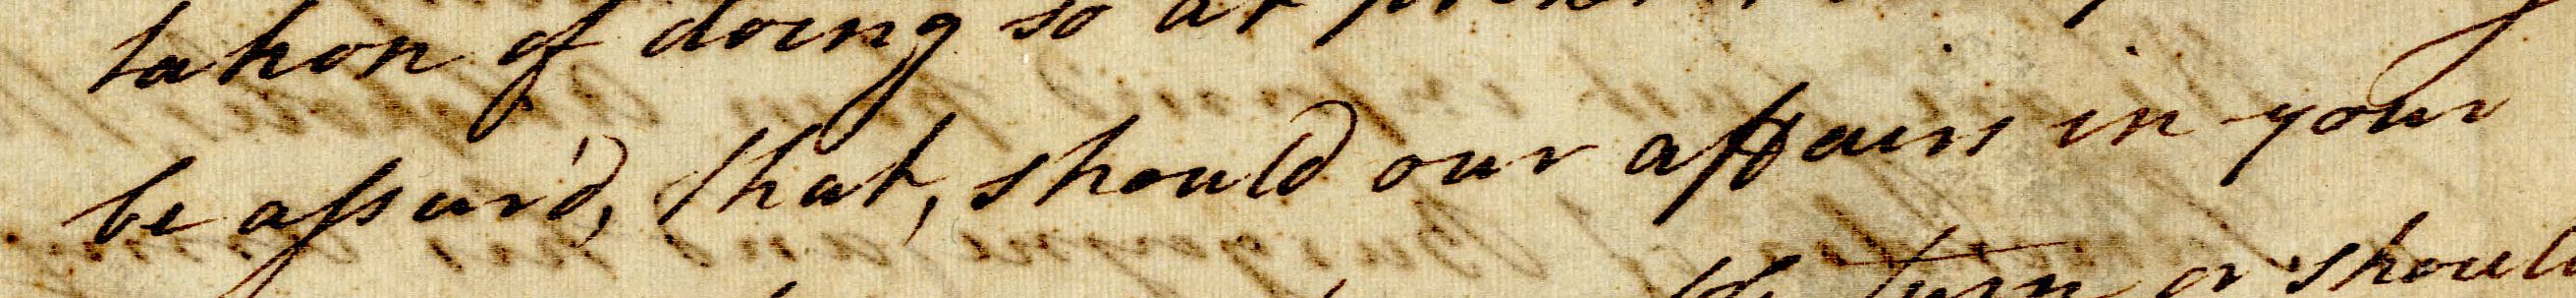be assur'd, that, should our affairs in your
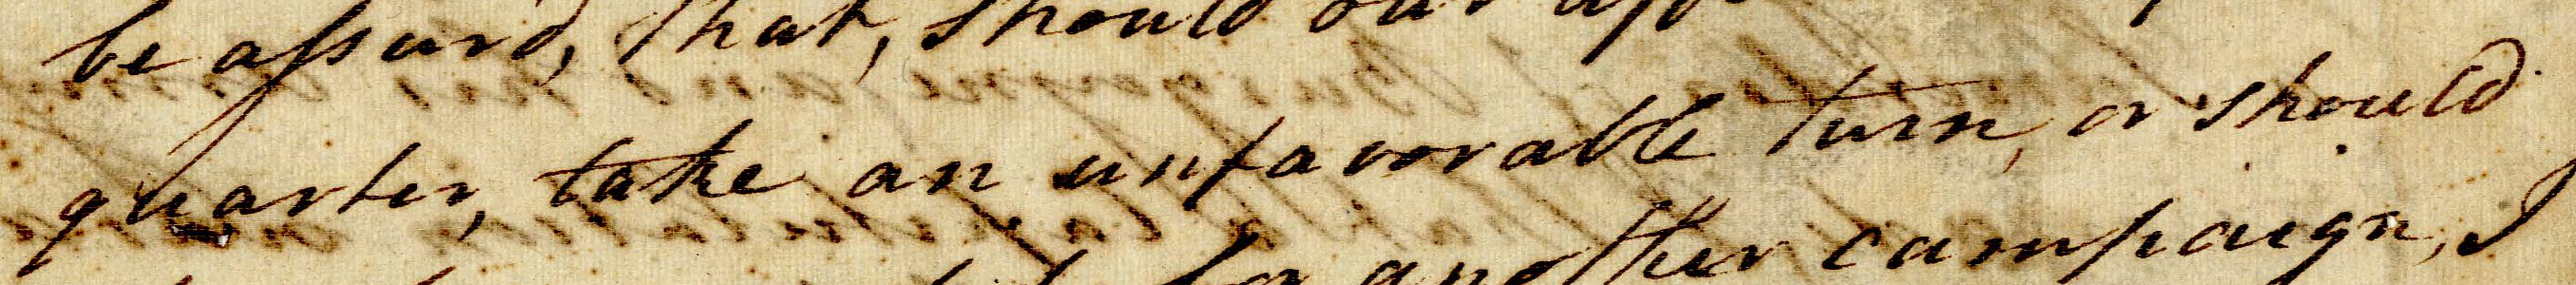quarter, take an unfavourable turn, or should
